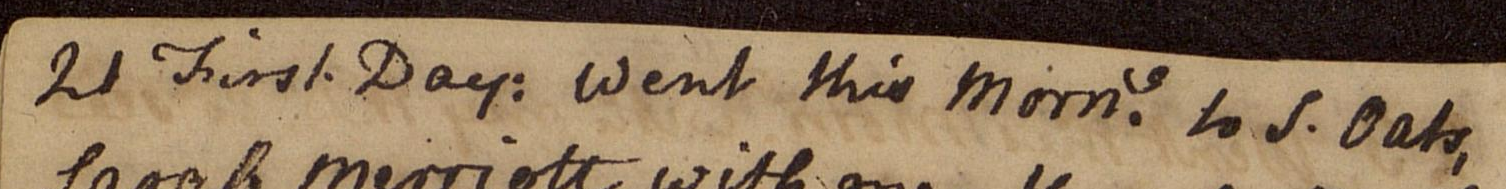21 First Day: went this Morn^g. to S. Oats,
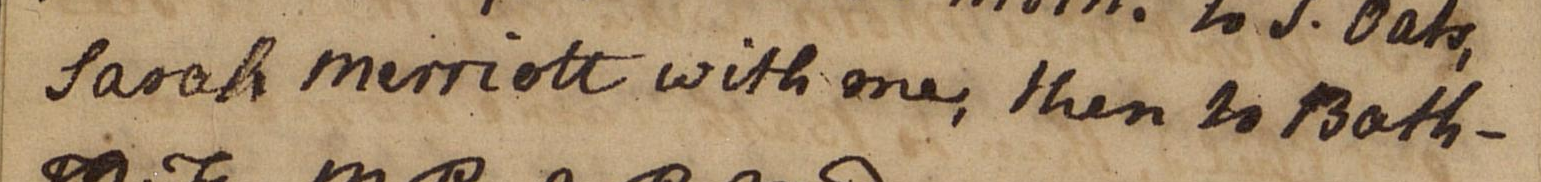Sarah Merriott with me, then to Bath-
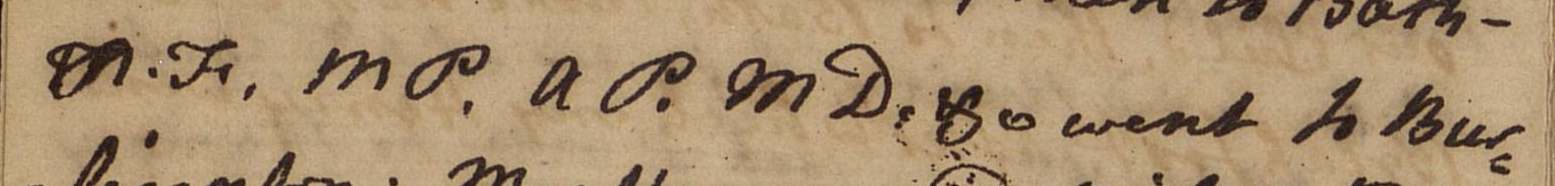T. F, MP, AP. MD, &c went to Bur-
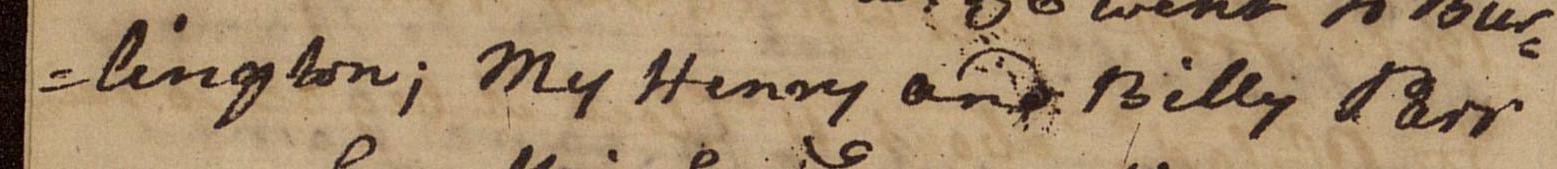-lington; My Henry and Billy Parr
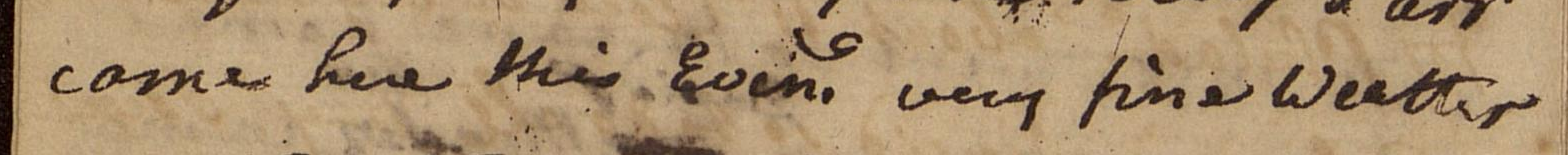came here this Even^g. very fine Weather
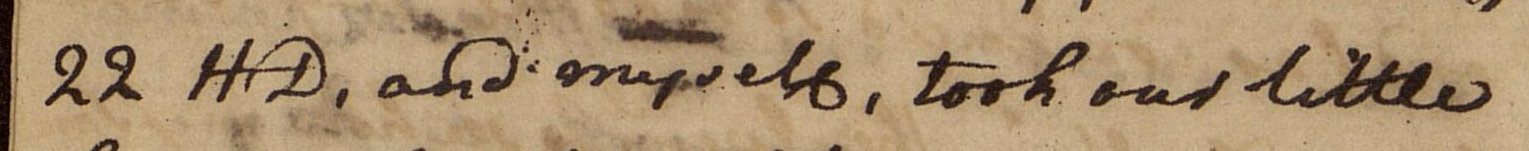22 HD, and myself, took our little
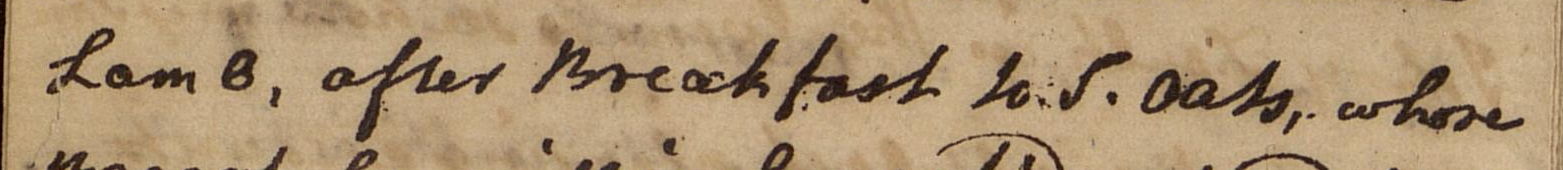Lamb, after Breakfast to S. Oats, whose
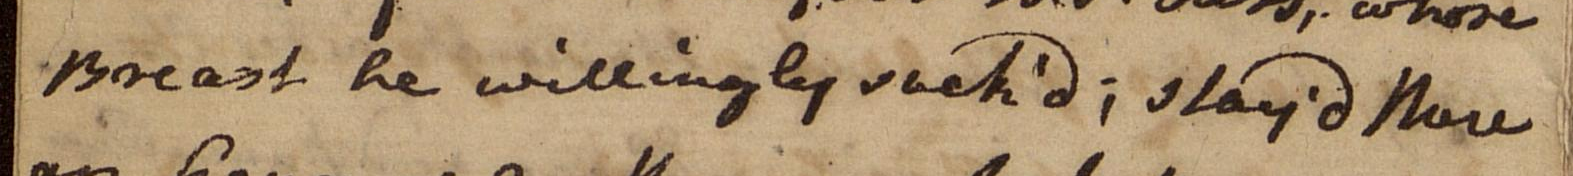Breast he willingly suck'd; stay'd there
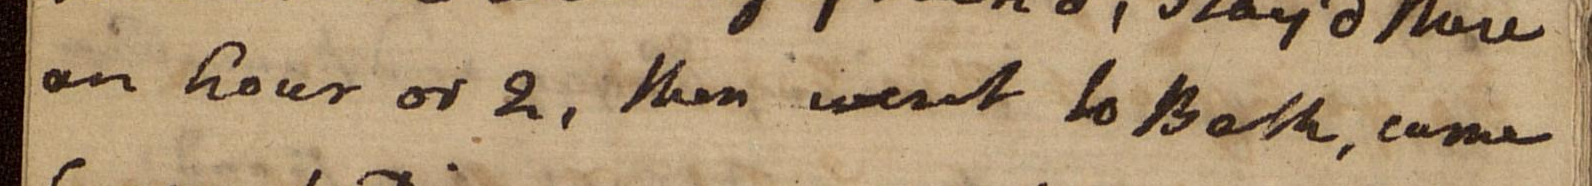an hour or 2, then went to Bath, came
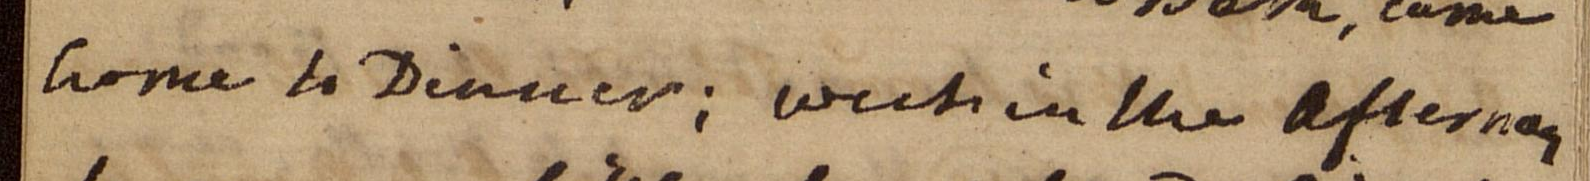home to Dinner; went in the afternoon
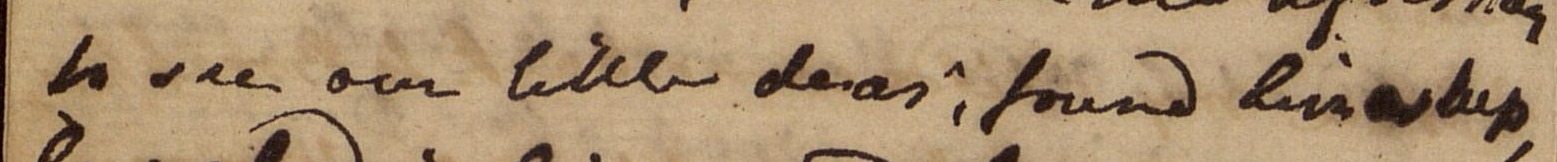to see our little dear, found him [asleep],
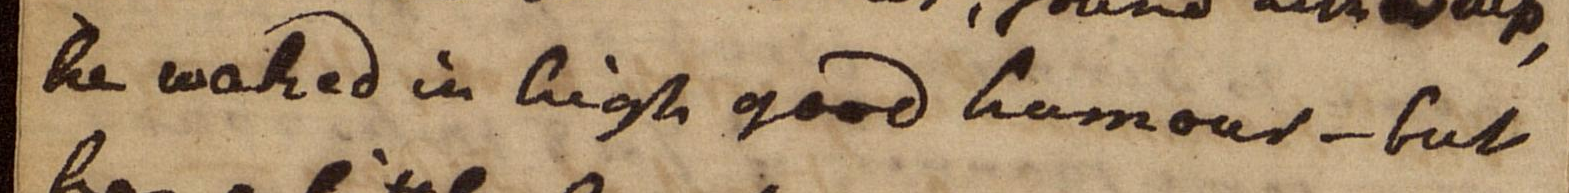he waked in high good humour- but
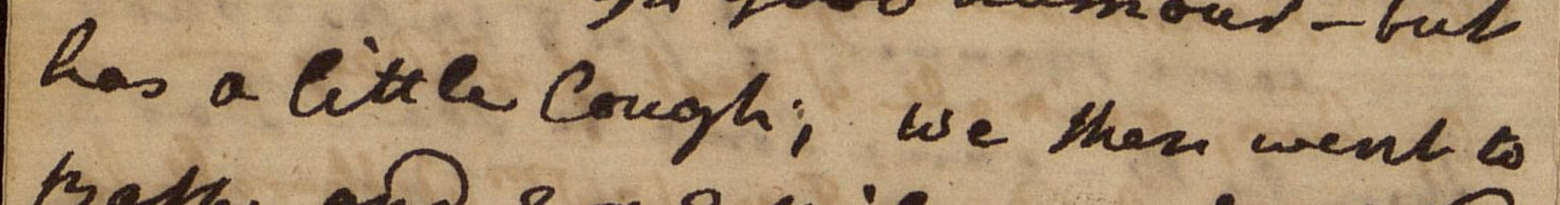has a little Cough; we then went to
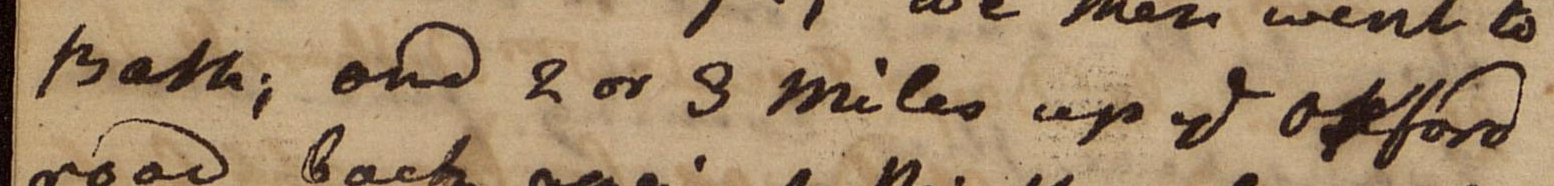Bath; and 2 or 3 miles up y^e Oxford
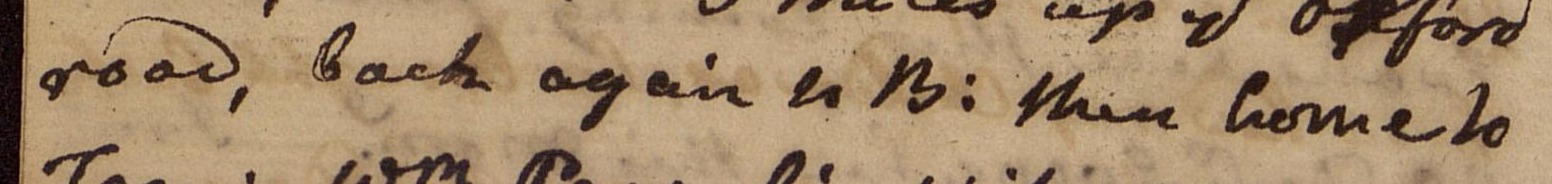road, back again to B: then home to
